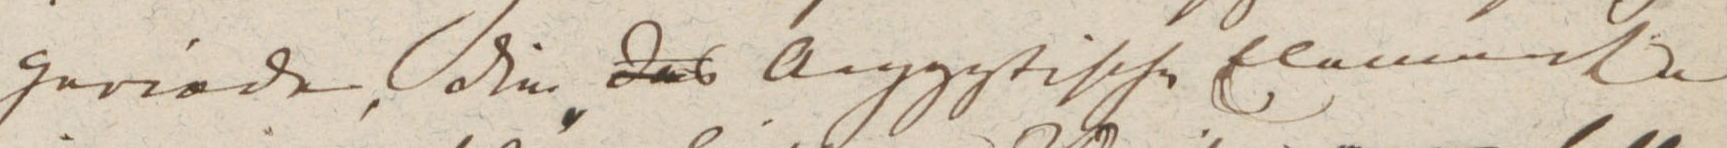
periode, die das Aegyptische Elemente
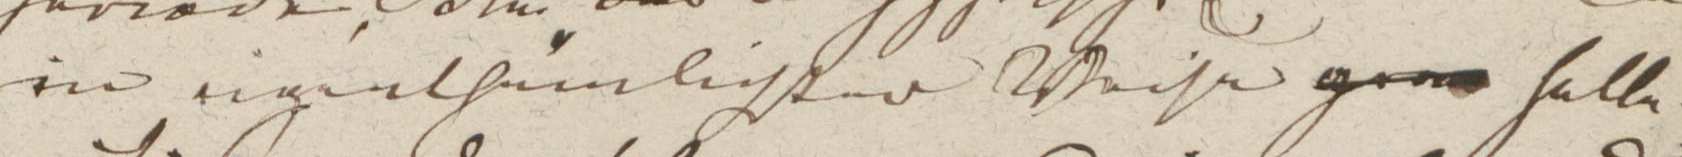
in eigenthümlichster Weise g helle-
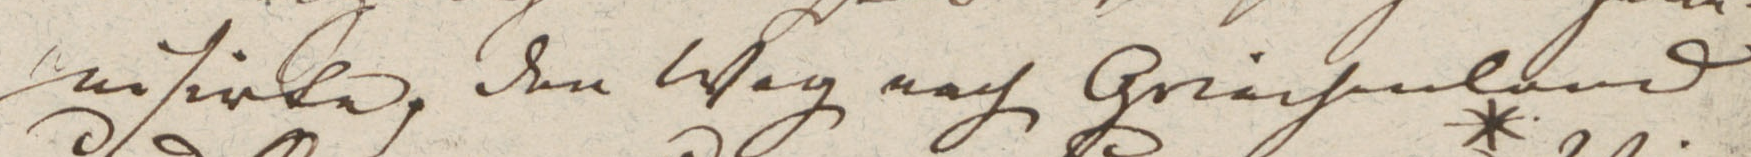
nisirte, den Weg nach Griechenland
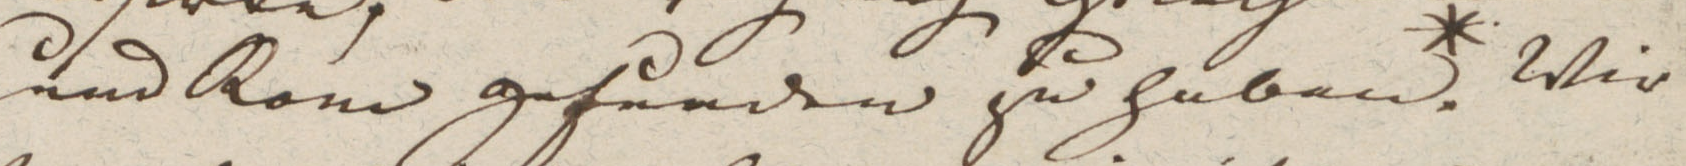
und Rom gefunden zu haben.% Wir
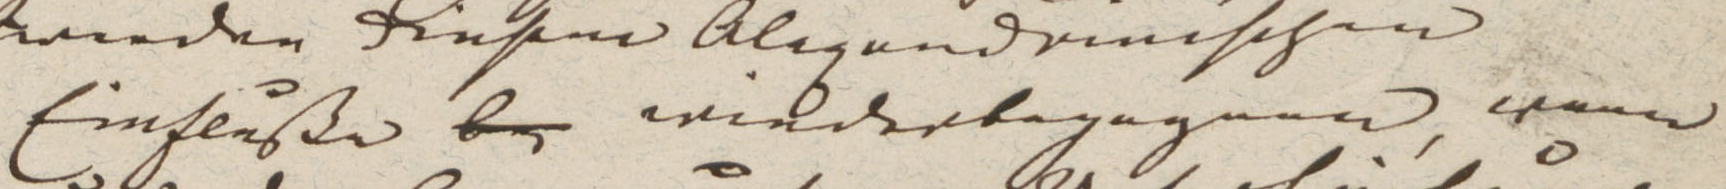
Einflusse b wiederbegegnen, wenn
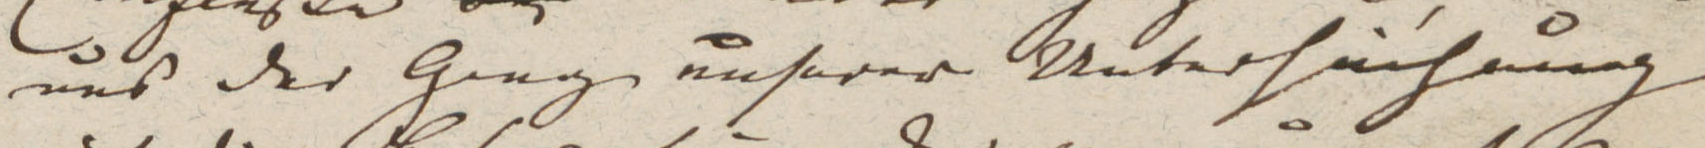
uns der Gang unserer Untersuchung
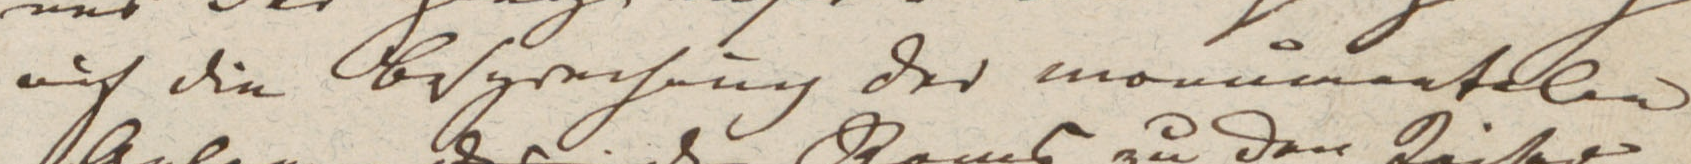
auf die Besprechung der monumentalen
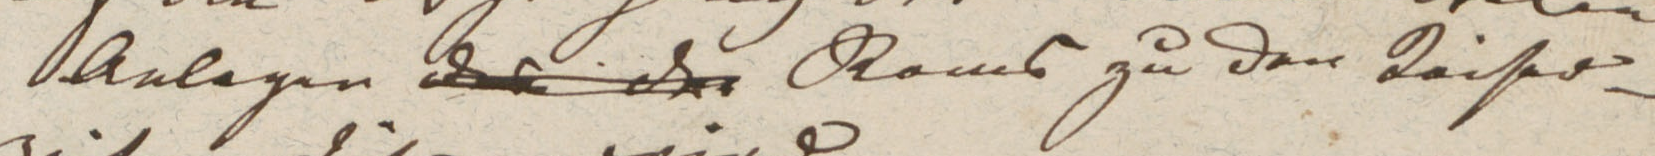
Anlagen das d Roms zu den Kaiser-
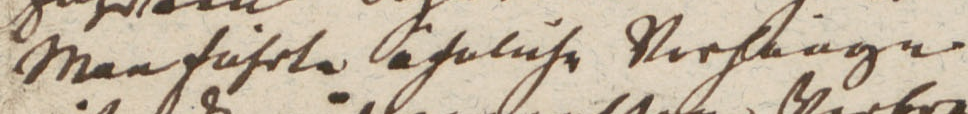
Man führte ähnliche Vorhänge
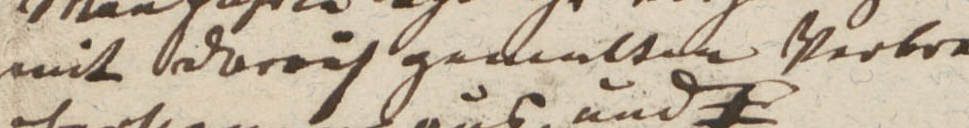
mit darauf gemalten Verbre-
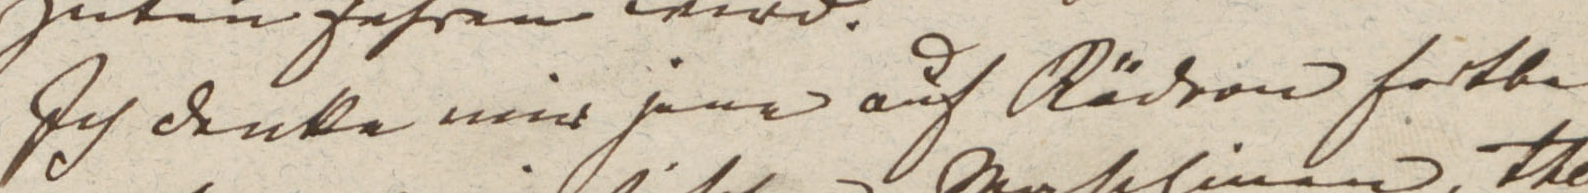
Ich denke mir jene auf Rädern fortbe-
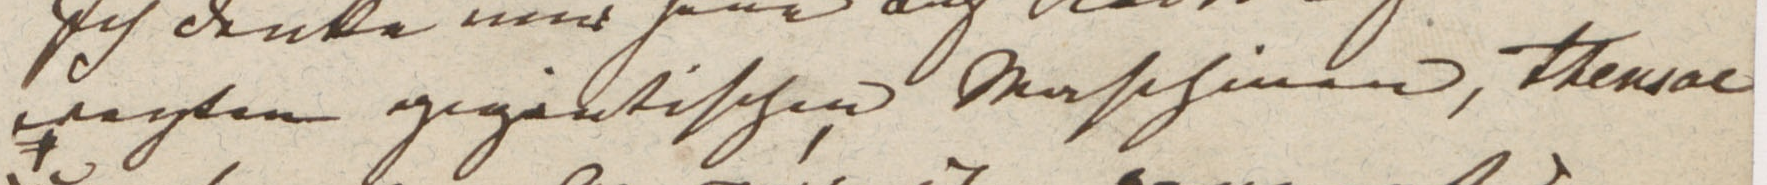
wegten gigantischen Maschinen, thensae
